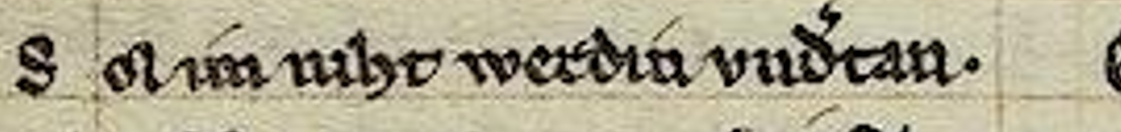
Sol im niht werdin vnd(er)tan.
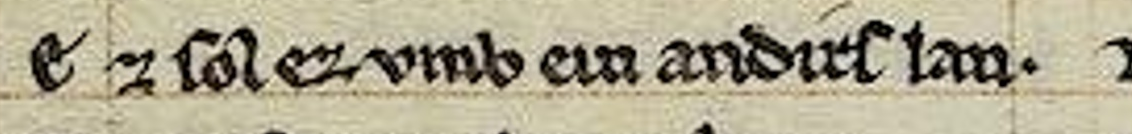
Ez ſol ez vmb ein andirſ lan.
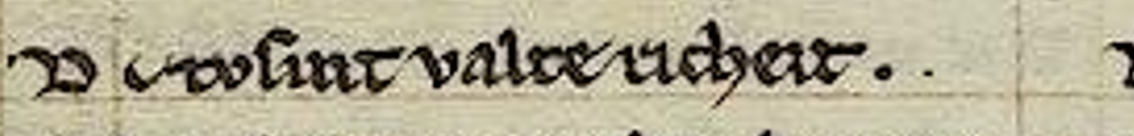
D(az) tvſint valte richeit.
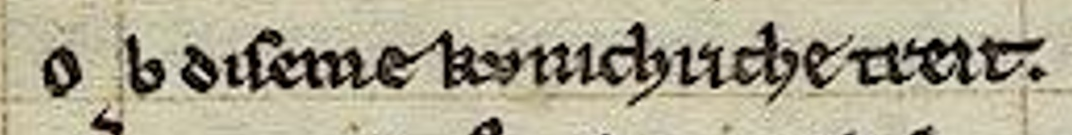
Ob diſeme kvnichriche treit.
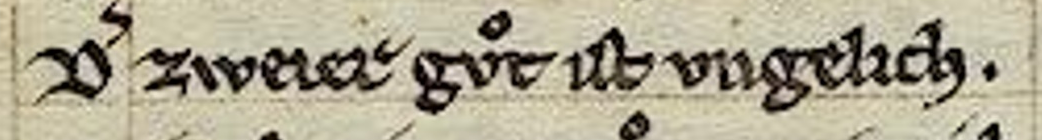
D(er) zweier gv°ot iſt vngelich.
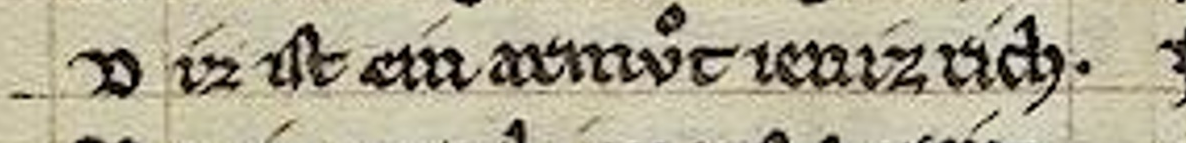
Diz iſt ein armv°ot ieniz rich.
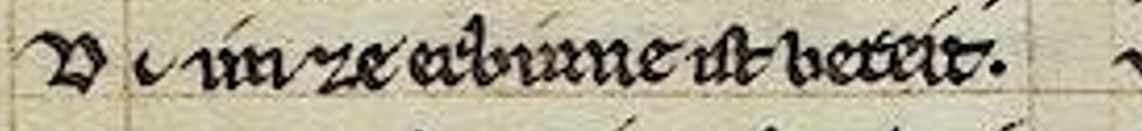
D(az) im ze erbinne iſt bereit.
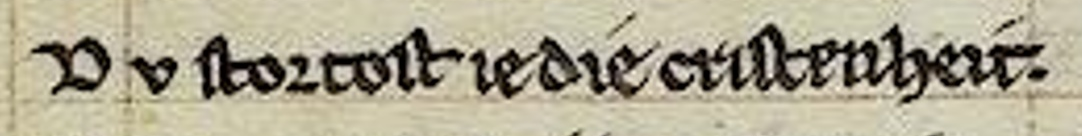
Dv ſtortoſt ie die criſtenheit.
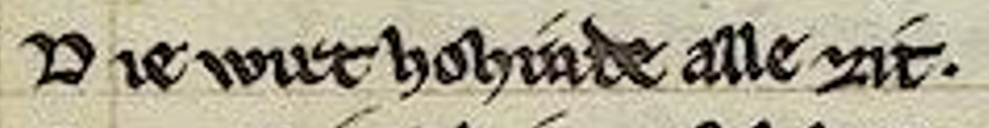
Die wirt hohinde alle zit.
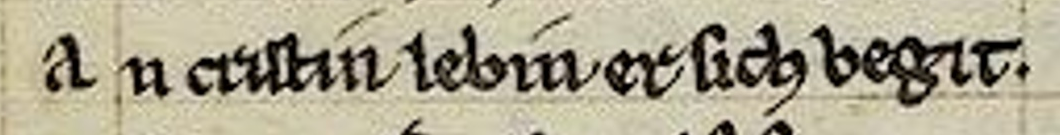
An criſtin lebin er ſich begit.
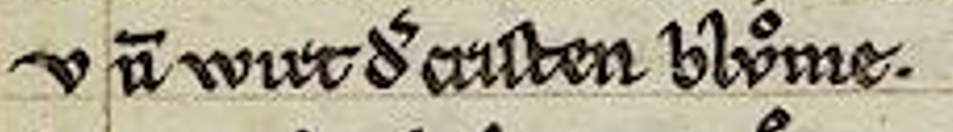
Vn(d) wirt d(er) criſten blv°ome.
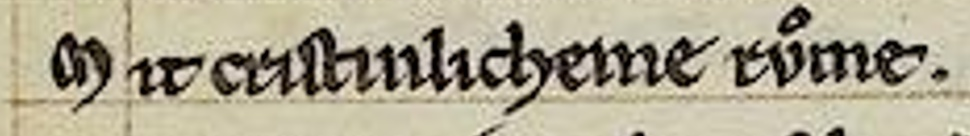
Mit criſtinlicheme rv°ome.
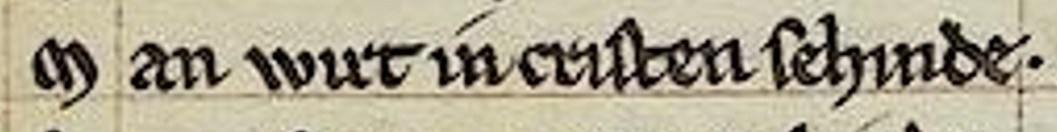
Man wirt in criſten ſehinde.
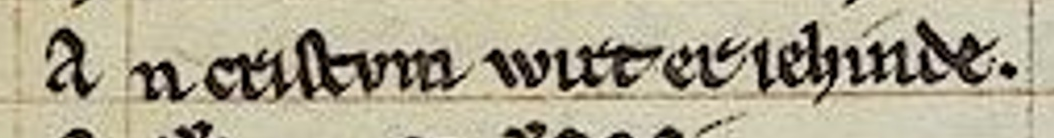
An criſtvm wirt er iehinde.
